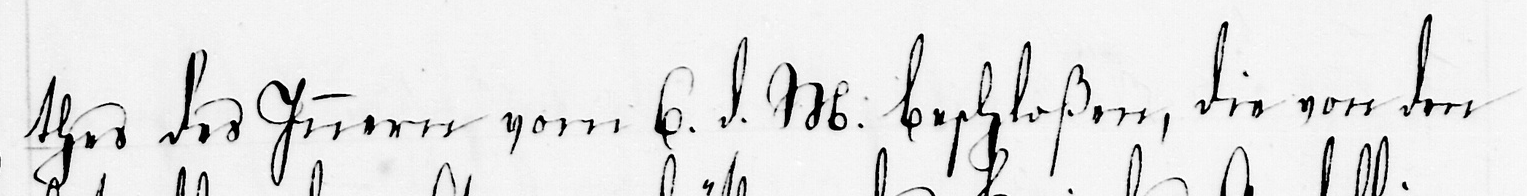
thes des Innern vom 6. d. M. beschloßen, die von den
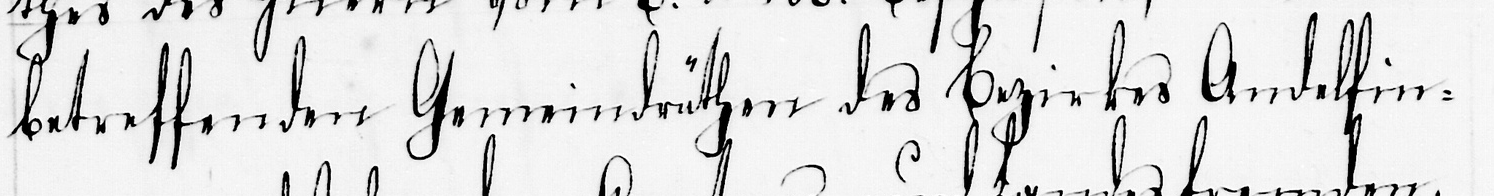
betreffenden Gemeindräthen des Bezirkes Andelfin¬
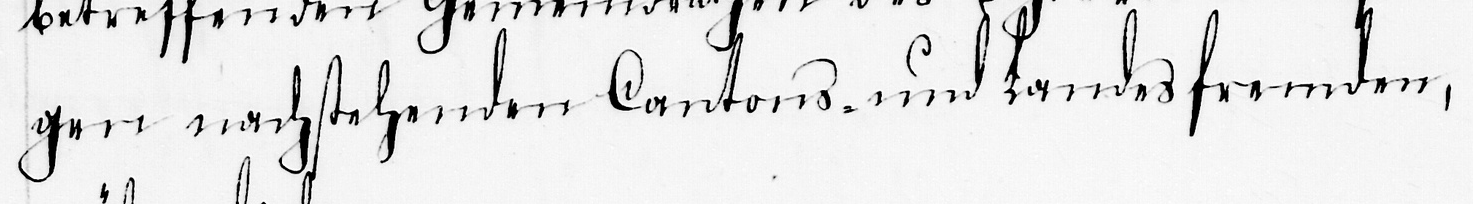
gen nachstehenden Cantons- und Landesfremden,
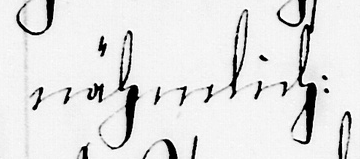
nähmlich:
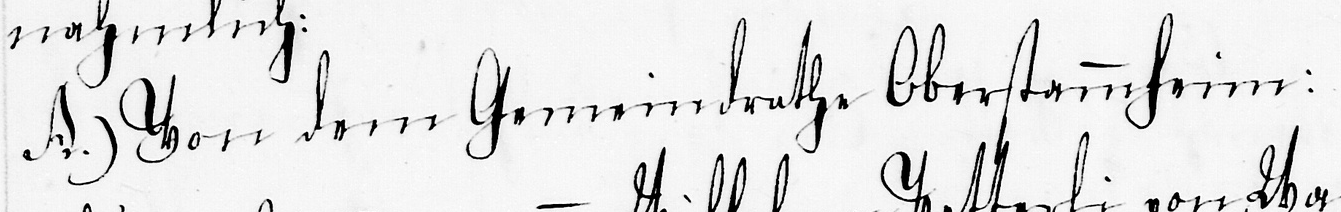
A.) Von dem Gemeindrathe Oberstammheim:
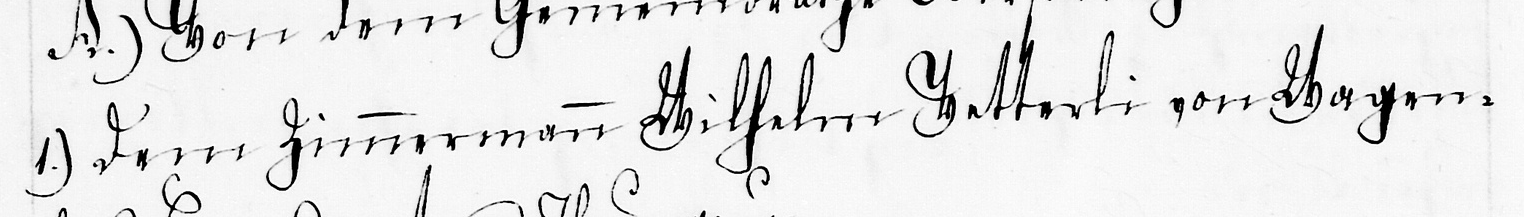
1.) Dem Zimmermann Wilhelm Vetterli von Wagen¬
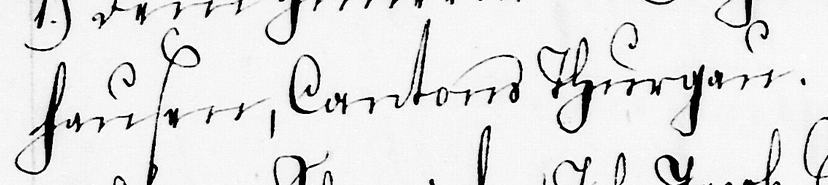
hausen, Cantons Thurgau.
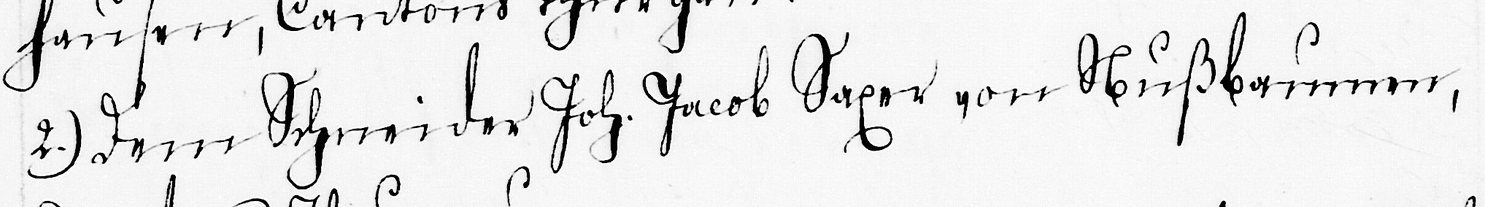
2.) Dem Schneider Joh. Jacob Saxer von Nußbaumen,
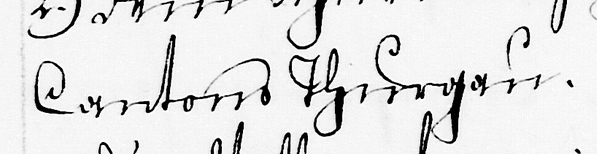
Cantons Thurgau.
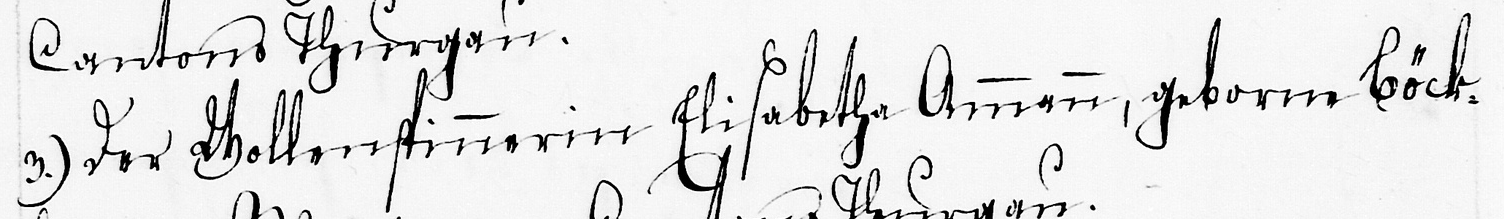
3.) Der Wollenspinnerin Elisabetha Ammann, geborne Böck¬
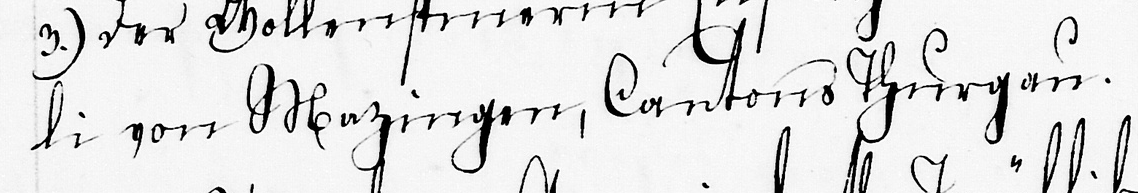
li von Mazingen, Cantons Thurgau.
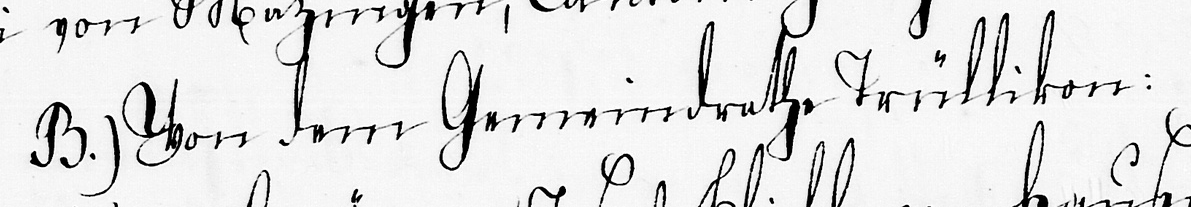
B.) Von dem Gemeindrathe Trüllikon:
